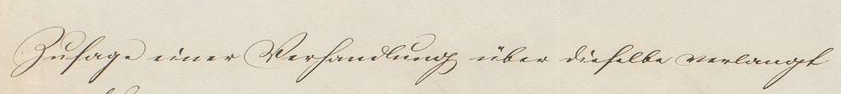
Zusage einer Verhandlung über dieselbe verlangt
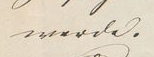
werde.
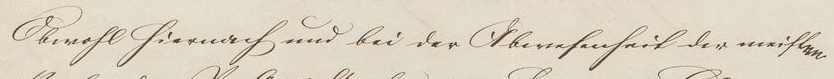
Obwohl hiernach und bei der Abwesenheit der meisten
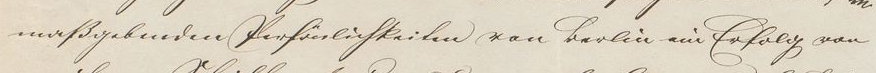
maßgebenden Persönlichkeiten von Berlin ein Erfolg von
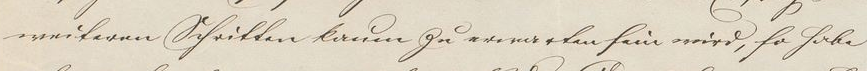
weiteren Schritten kaum zu erwarten sein wird, so habe
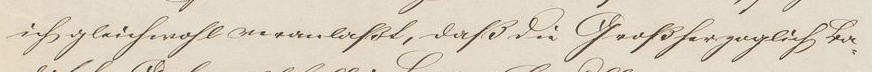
ich gleichwohl veranlaßt, daß die Großherzoglich Ba-
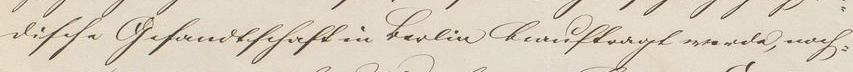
dische Gesandtschaft in Berlin beauftragt werde, noch-
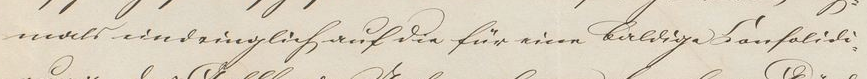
mals eindringlich auf die für eine baldige Consolidi-
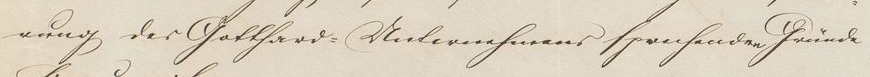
rung des Gotthard-Unternehmens sprechenden Gründe
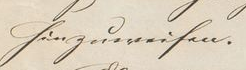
hinzuweisen.
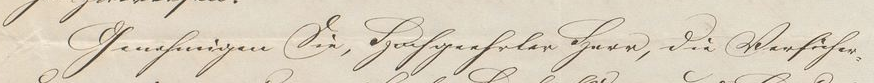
Genehmigen Sie, hochgeehrter Herr, die Versicher-
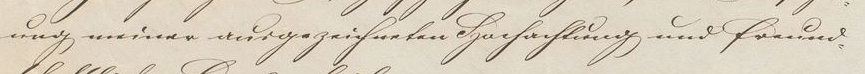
ung meiner ausgezeichneten Hochachtung und freund-
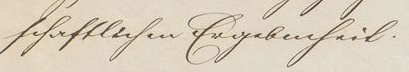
schaftlichen Ergebenheit.
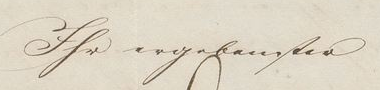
Ihr ergebenster
